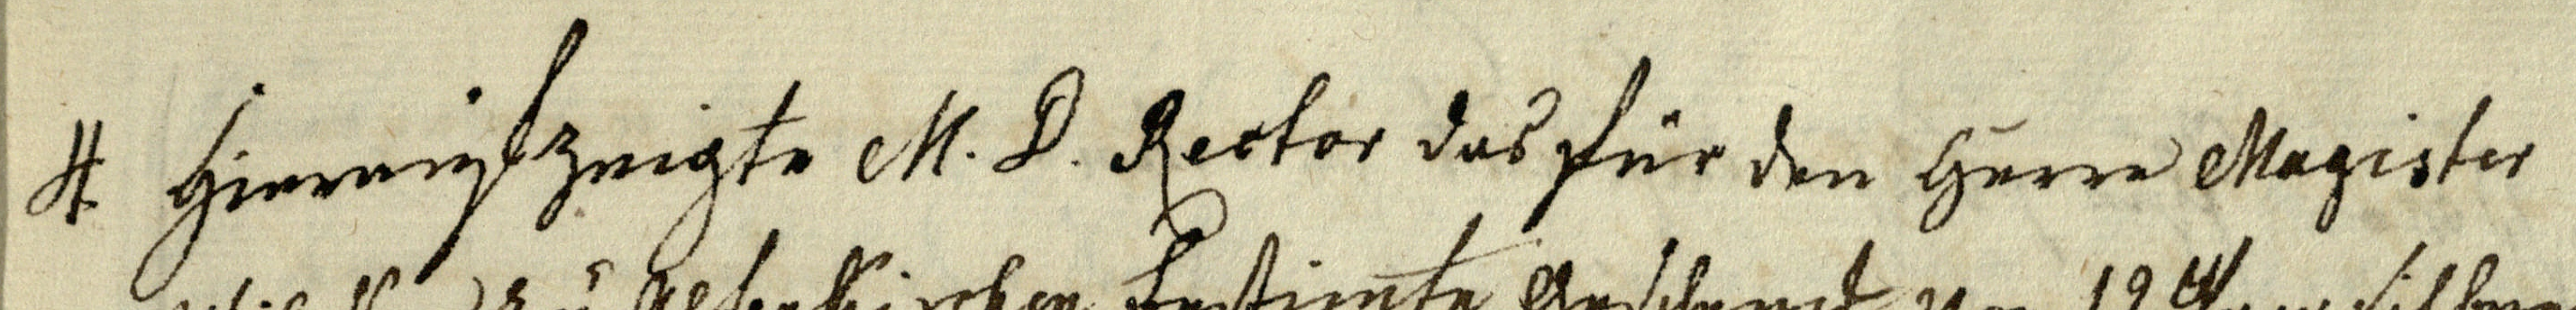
4. Hiernegst zeigte M. D. Rector das für den Herrn Magister
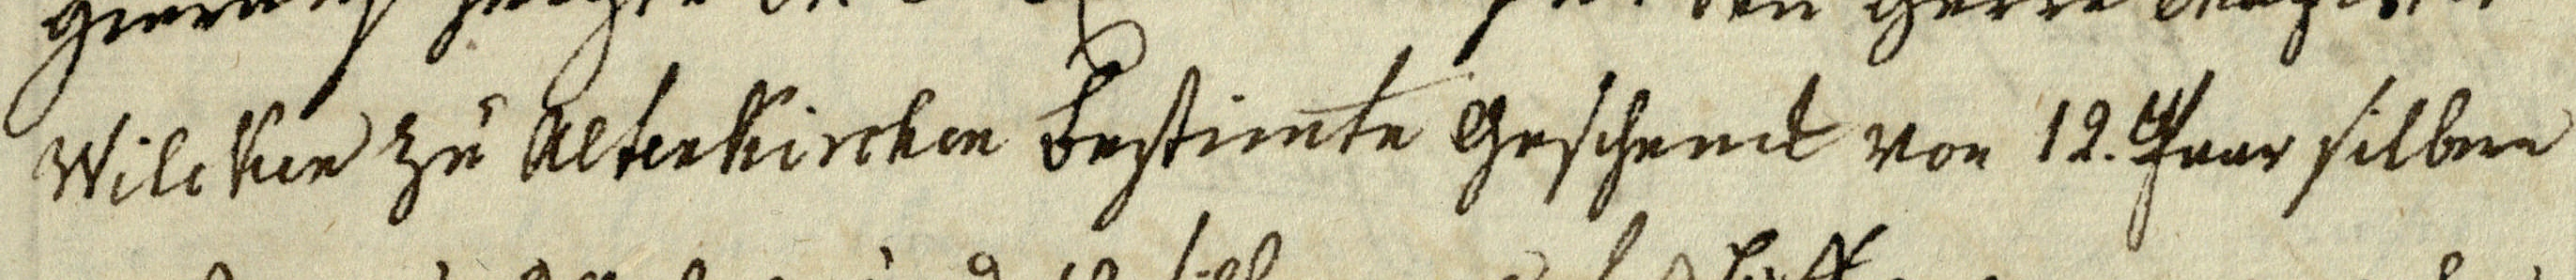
Wilcken zu Altenkirchen bestimte Geschenk von 12 Paar silbern
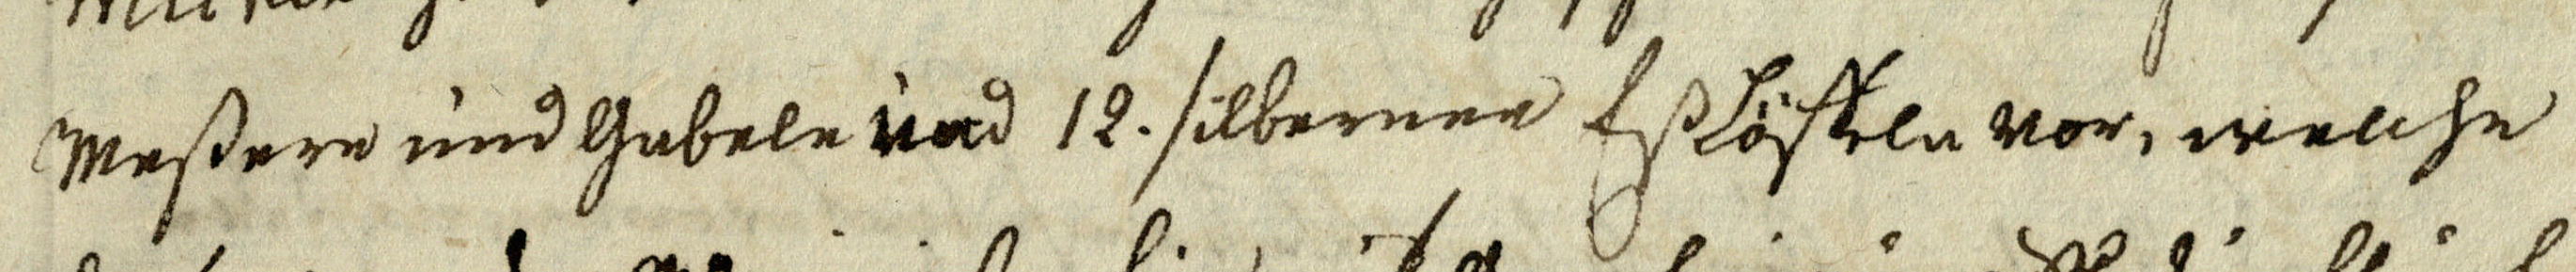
Meßern und Gabeln und 12 silbernen Eßlöffeln vor, welche
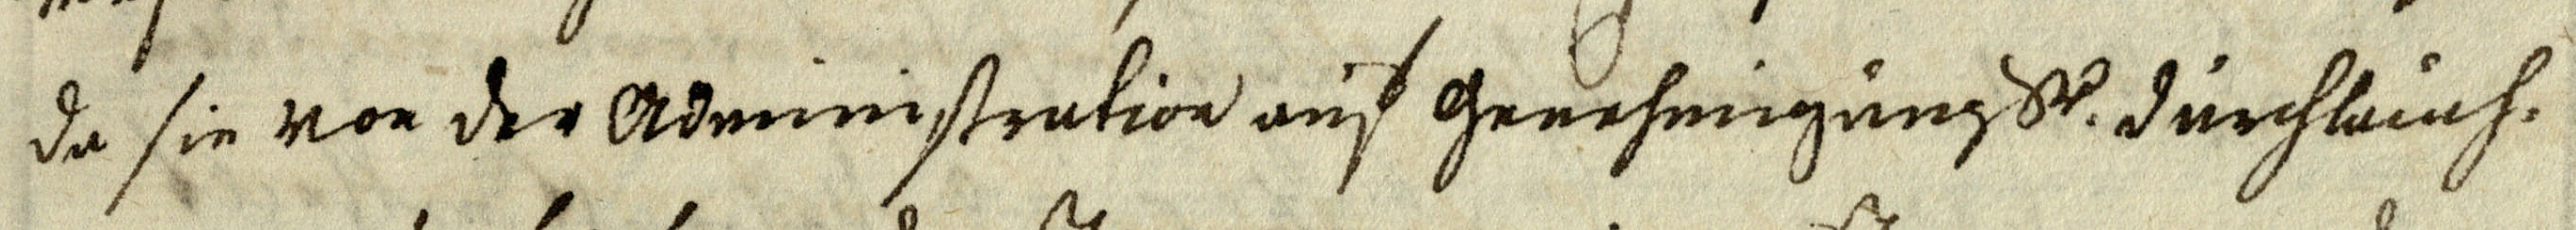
da sie von der Administration auf Genehmigung Sr. durchlauch¬
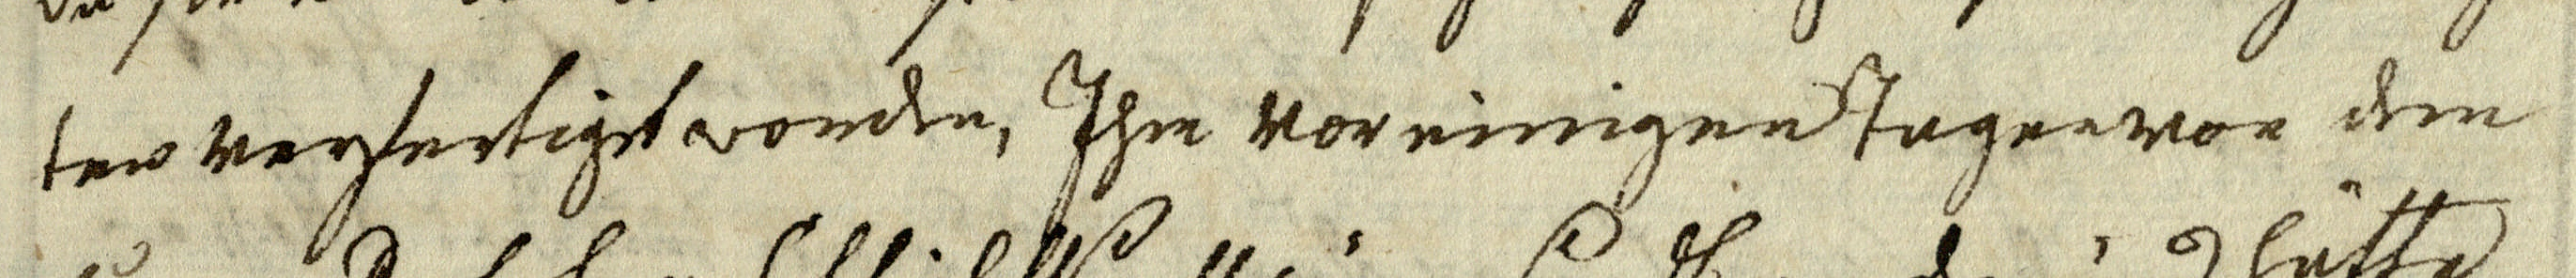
ten verfertiget worden, Ihm vor einigen Tagen von dem
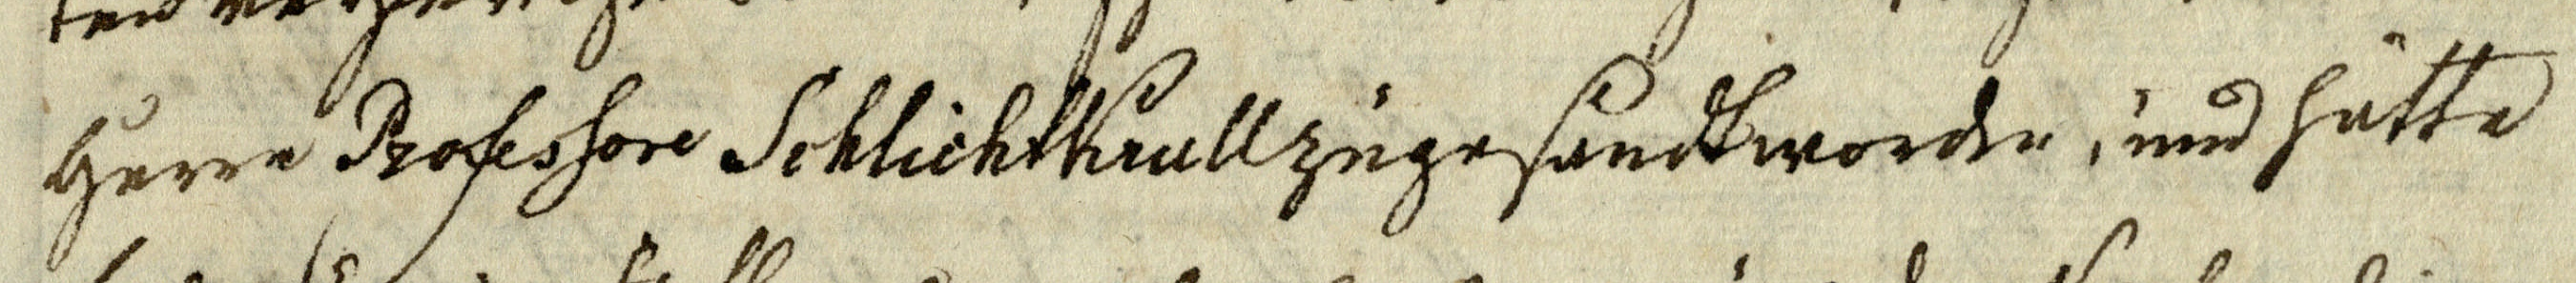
Herrn Professore Schlichtkrull zugesandt worden, und hätte
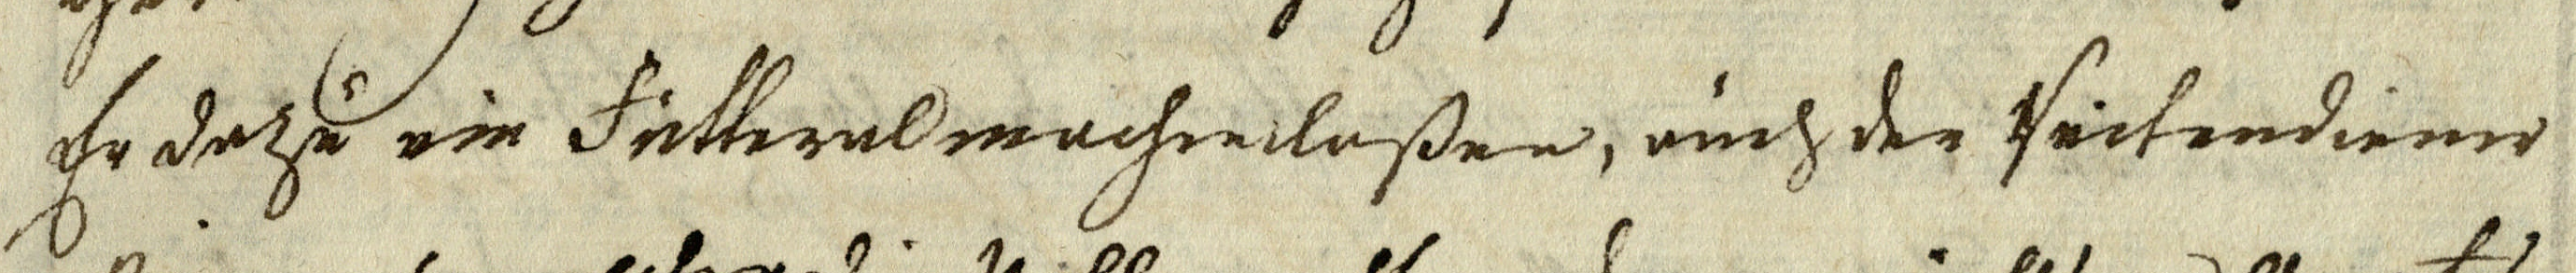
Er dazu ein Futteral machen laßen, und der Reitendiener
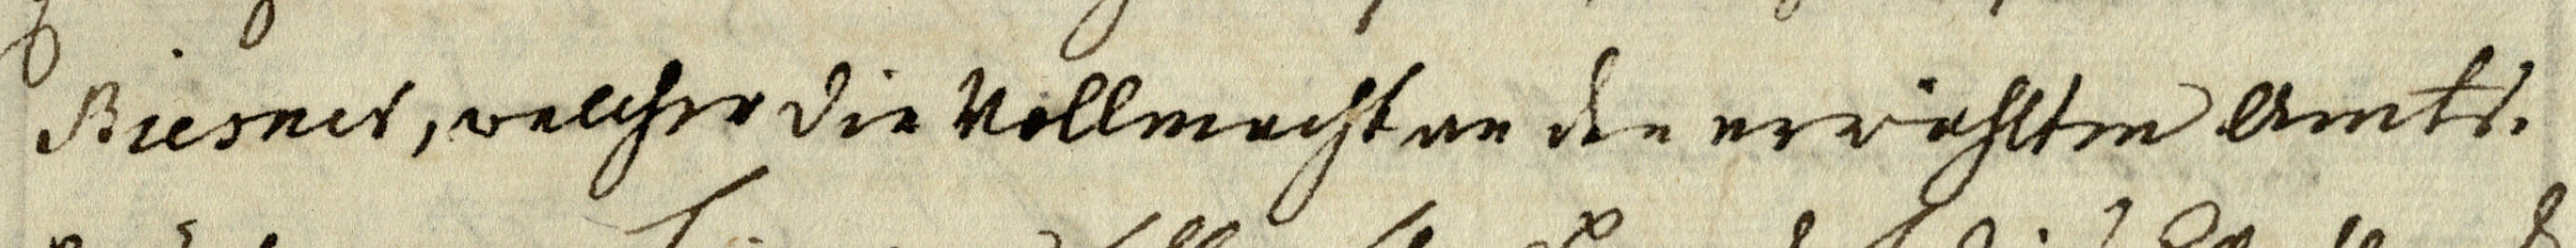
Biesner, welcher die Vollmacht an den erwählten Amts¬
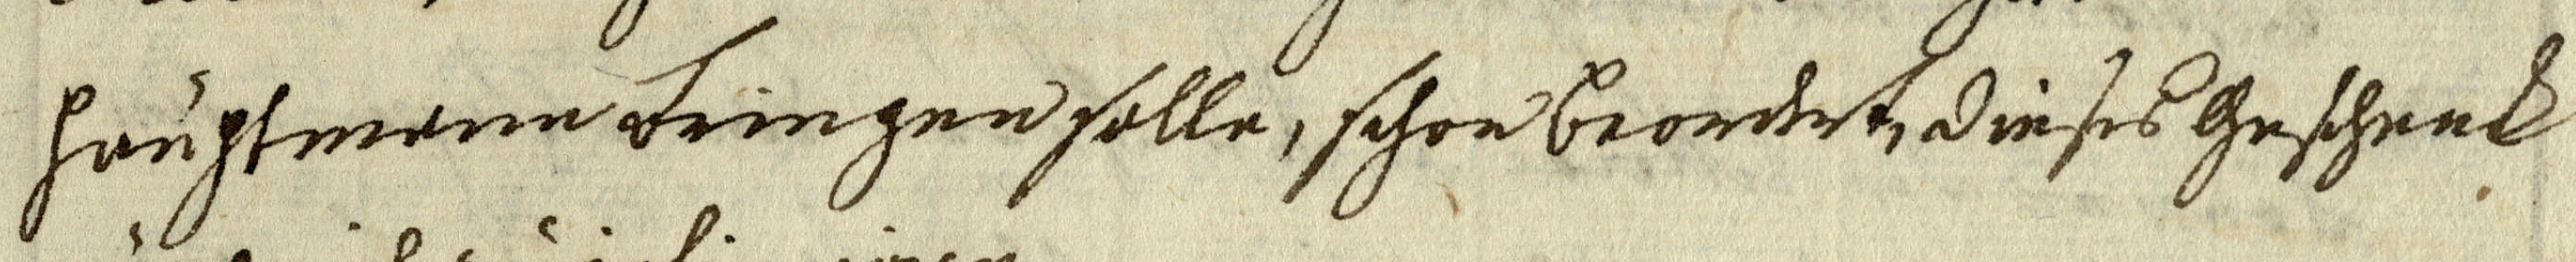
Hauptmann bringen solle, schon beordert, dieses Geschenk
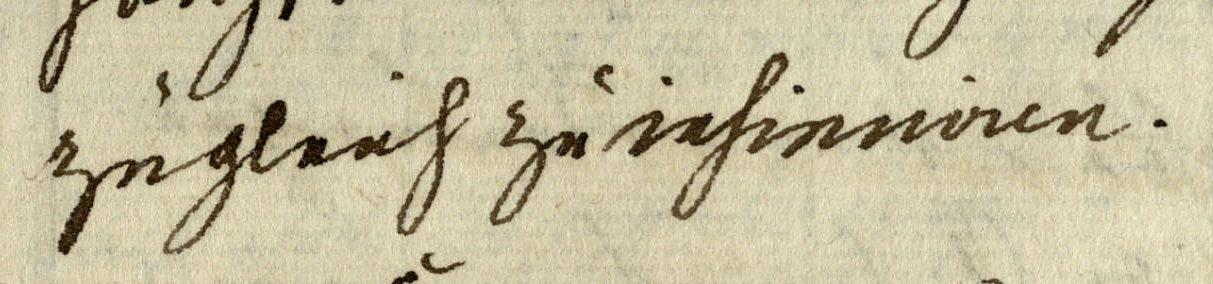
zugleich zu insinuirren.
